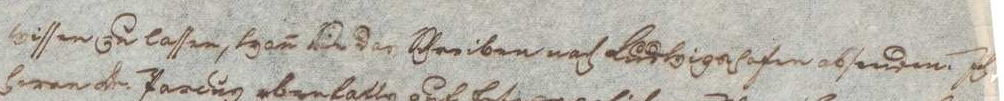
wissen zu lassen, wenn Sie das Schreiben nach Ludwigshafen absenden. Ich
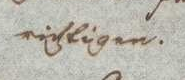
richtigen.
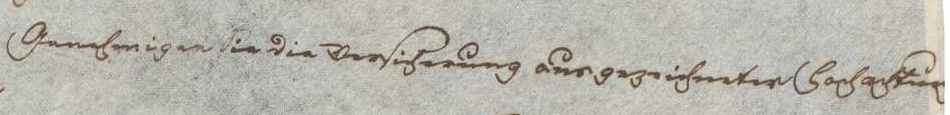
Genehmigen Sie die Versicherung ausgezeichneter Hochachtung
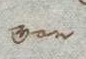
von
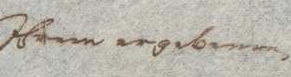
Ihrem ergebenen
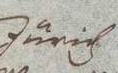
Zürich
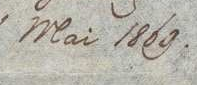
Mai 1866.
